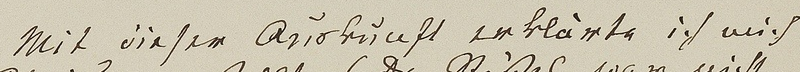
Mit dieser Auskunft erklärte ich mich
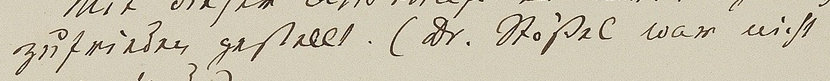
zufrieden gestellt. (Dr. Stößel war nicht
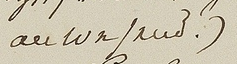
anwesend.)
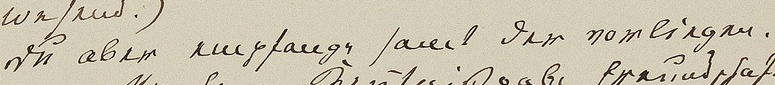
Du aber empfange samt der vorliegen-
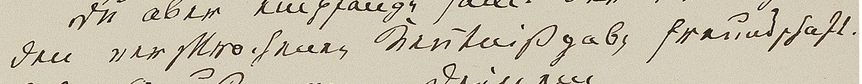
den versprochenen Kenntnißgabe freundschaft-
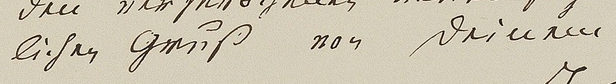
lichen Gruß von Deinem
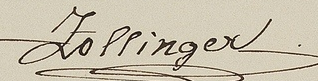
Zollinger.
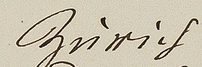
Zürich
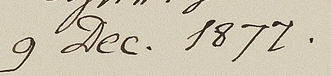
9 Dec. 1877.
